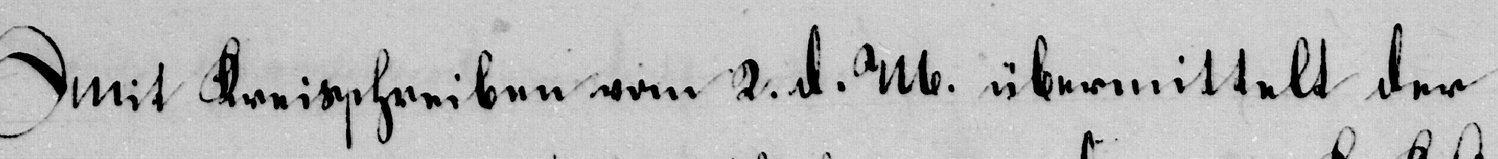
Mit Kreisschreiben vom 2. d. M. übermittelt der
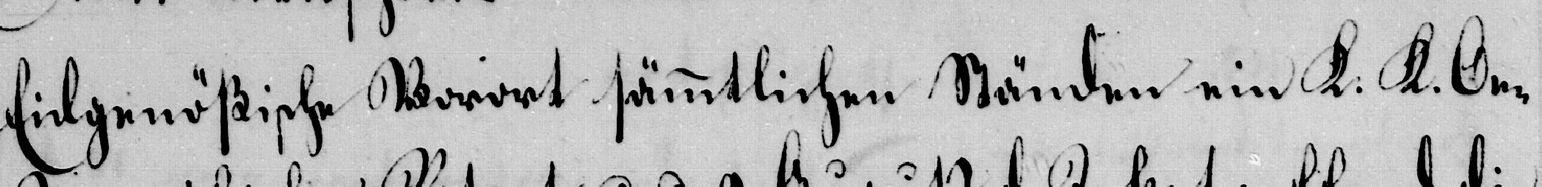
Eidgenößische Vorort sämmtlichen Ständen ein K. K. Oes¬
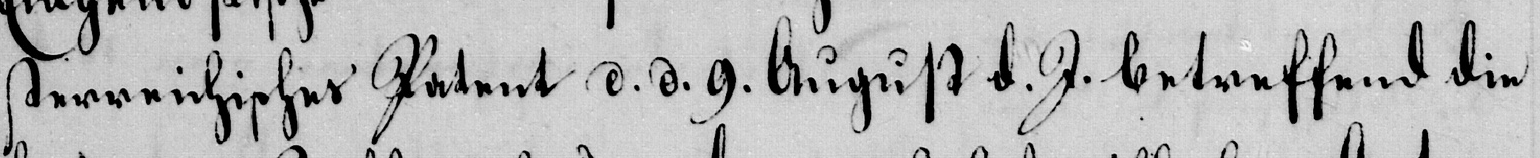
terreichisches Patent d. d. 9. August d. J. betreffend die
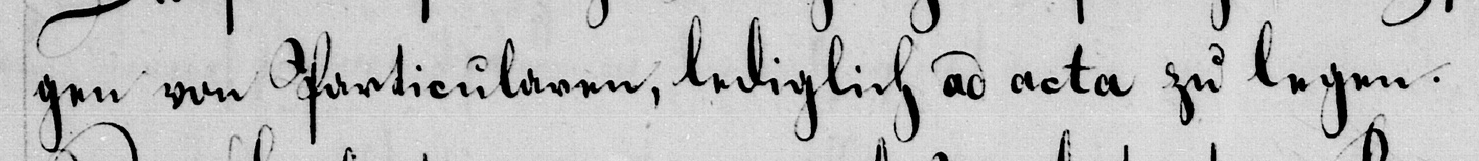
gen von Particularen, lediglich ad acta zu legen.
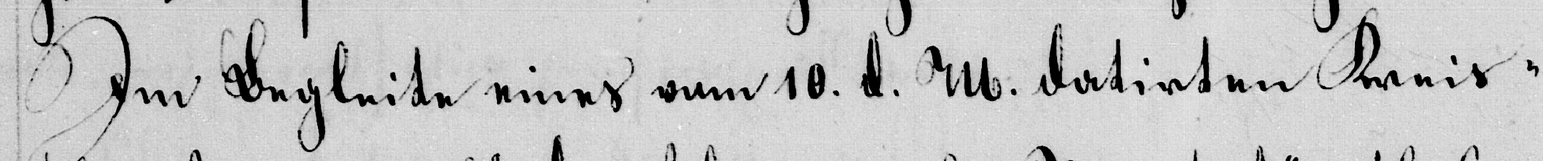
Im Begleite eines vom 10. d. M. datirten Kreis¬
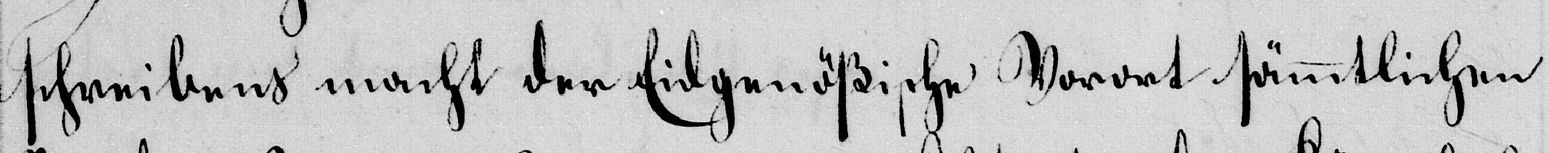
schreibens macht der Eidgenößische Vorort sämmtlichen
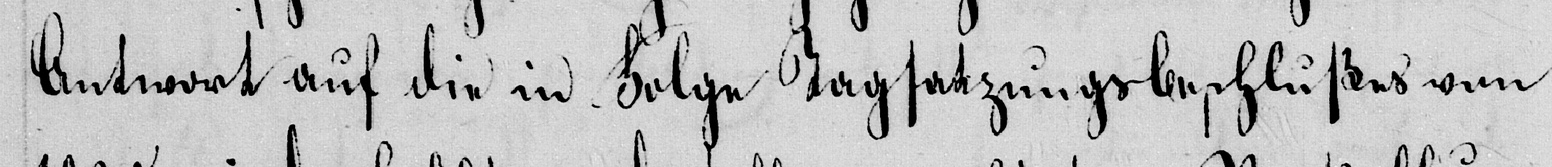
Antwort auf die in Folge Tagsatzungsbeschlußes von
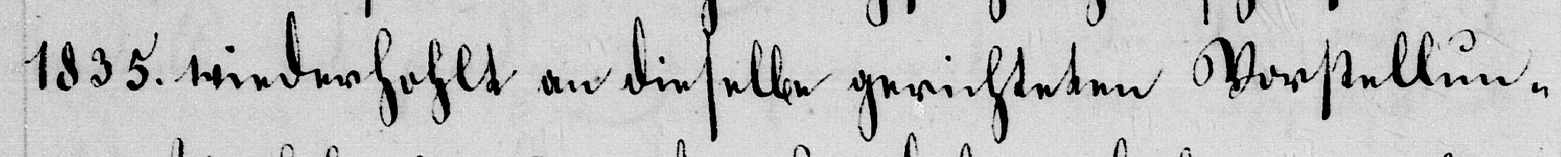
1835. wiederhohlt an dieselbe gerichteten Vorstellun¬
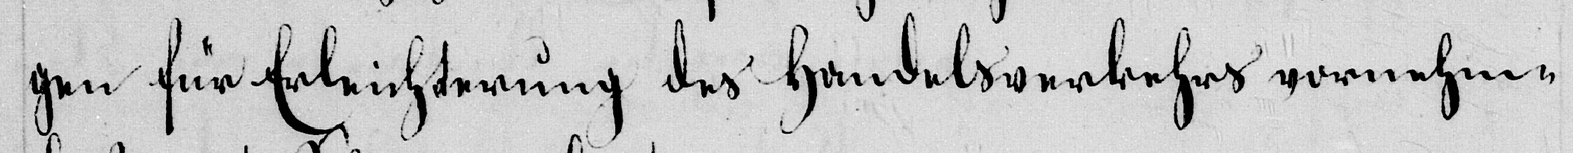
gen für Erleichterung des Handelsverkehrs vornehm¬
